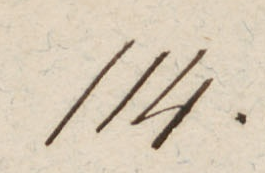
114.
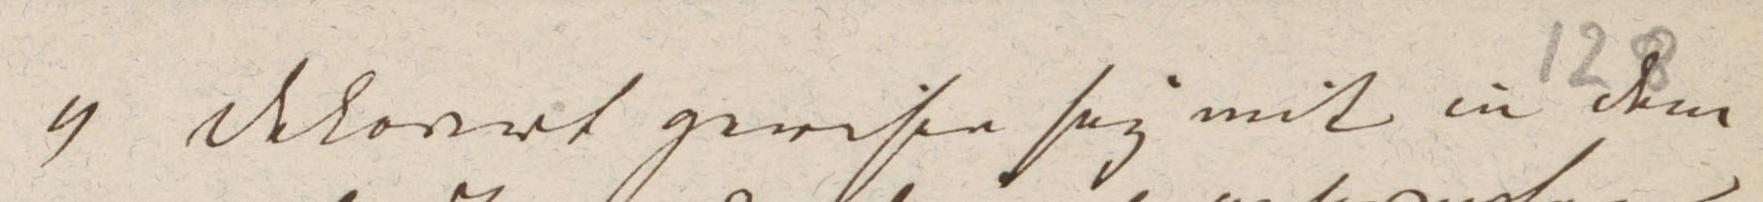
"dekorirt gewesen sey mit in dem
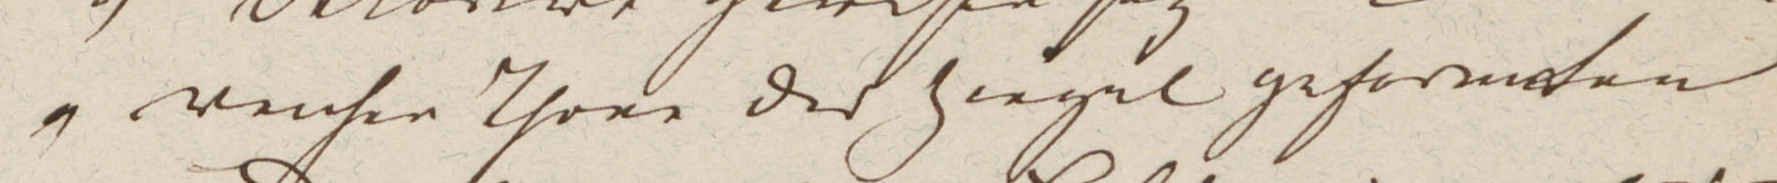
"weichen Thone der Ziegel geformten
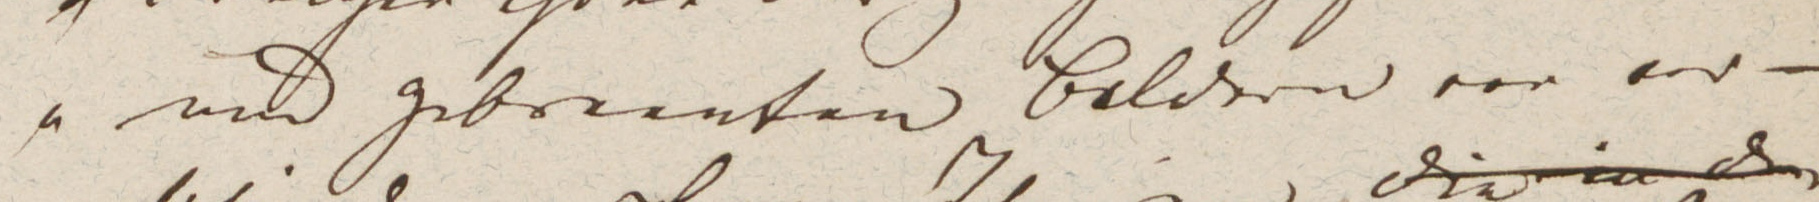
"und gebrannten Bildern vo ver-
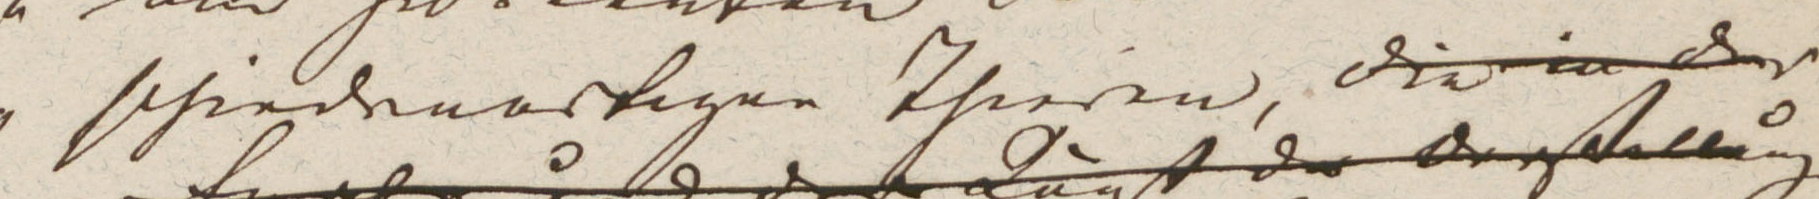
"schiedenartigen Thieren, die in der
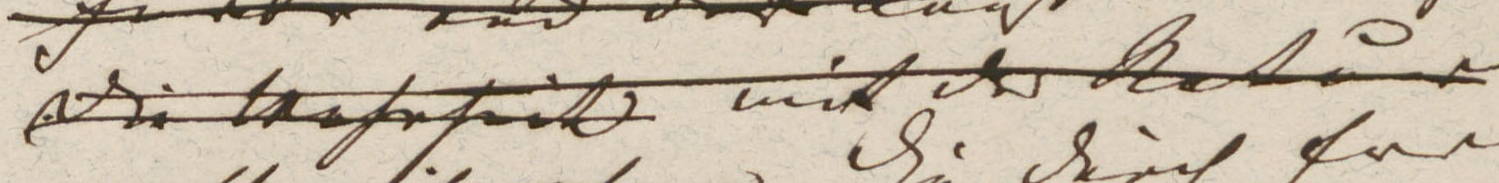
die Wahrheit mit der Natur
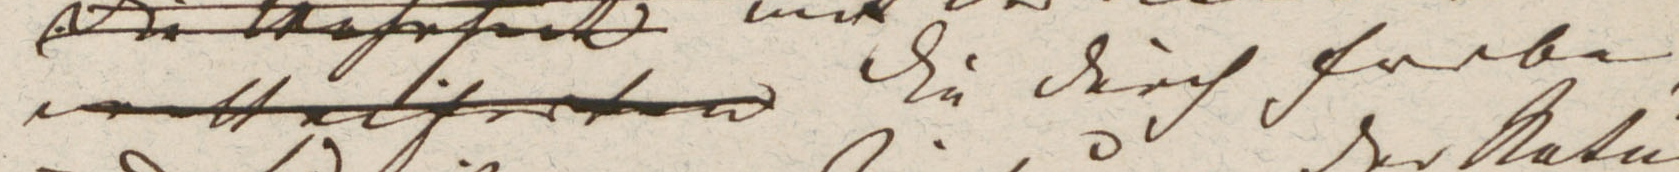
"wetteiferten ie durch Farbe
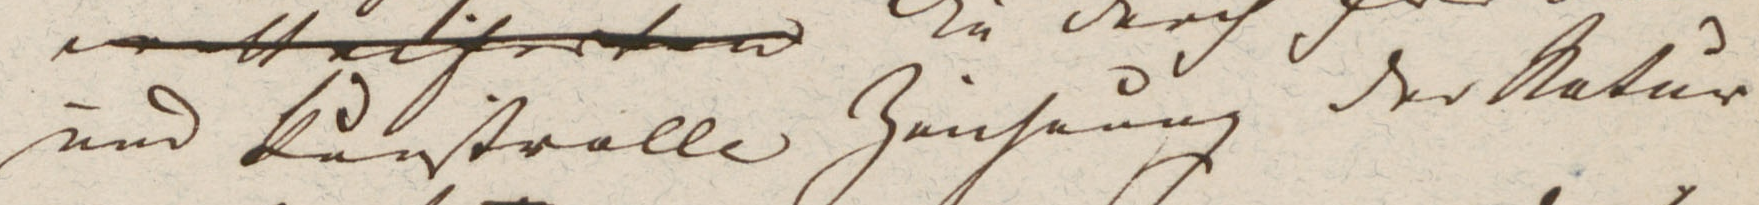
und kunstvolle Zeichnung der Natur
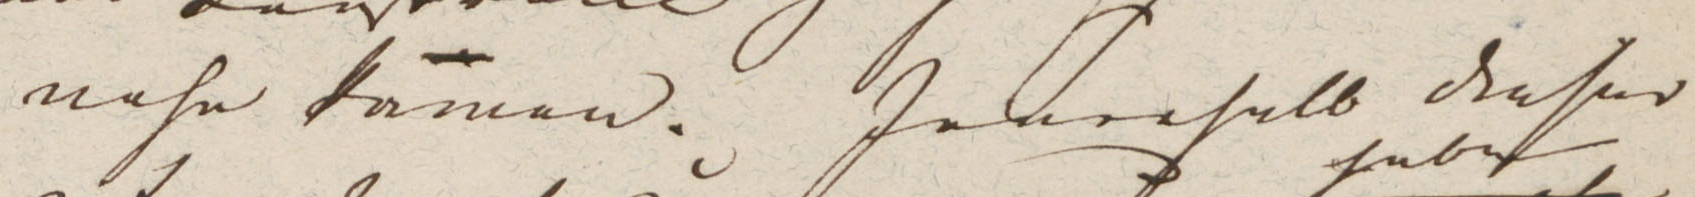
"nahe käamen. Innerhalb dieser
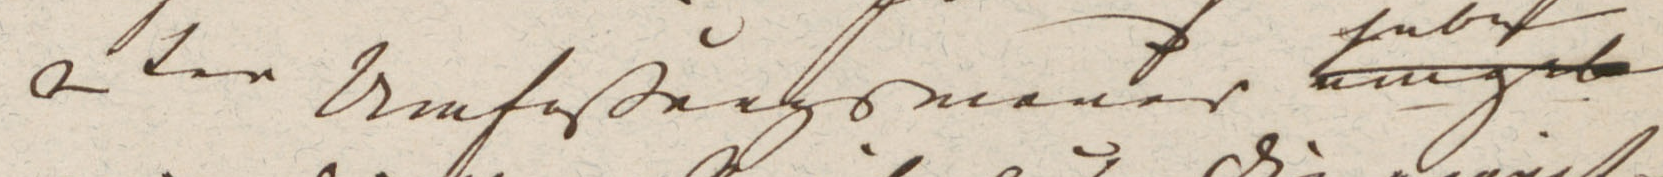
"2ten Umfassungsmauer umgab
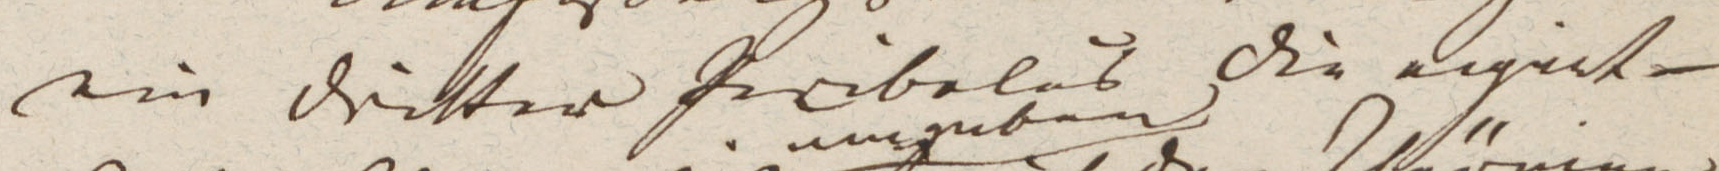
"ein dritter Peribolus die eigent-
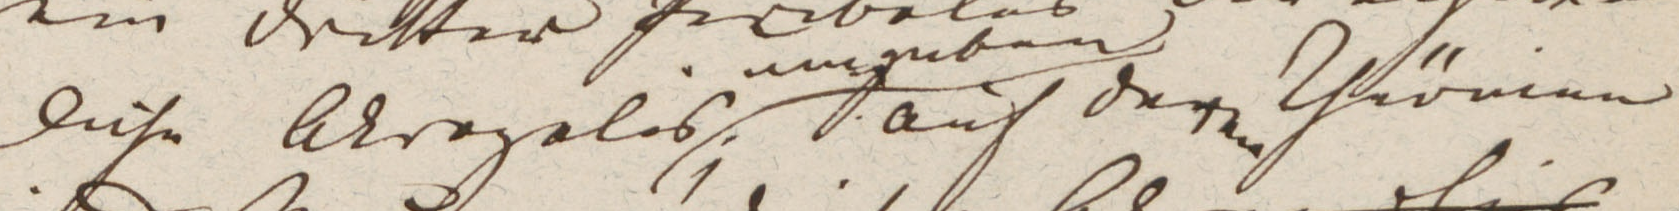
"liche Akropolis umgeben; Auf deren Thürmen
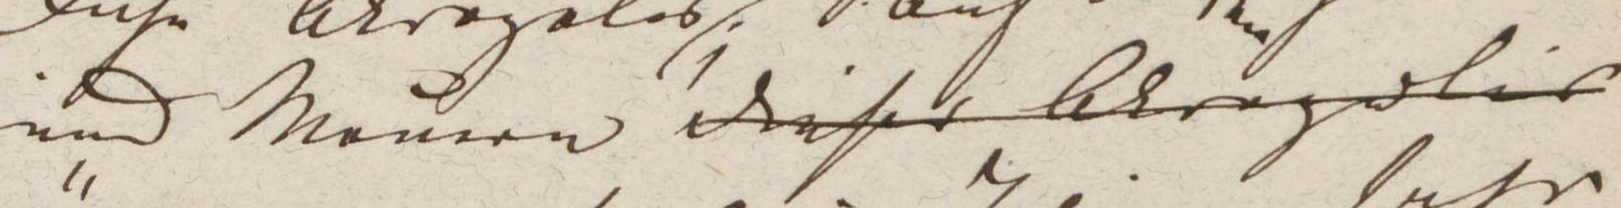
"und Mauern dieser Akropolis
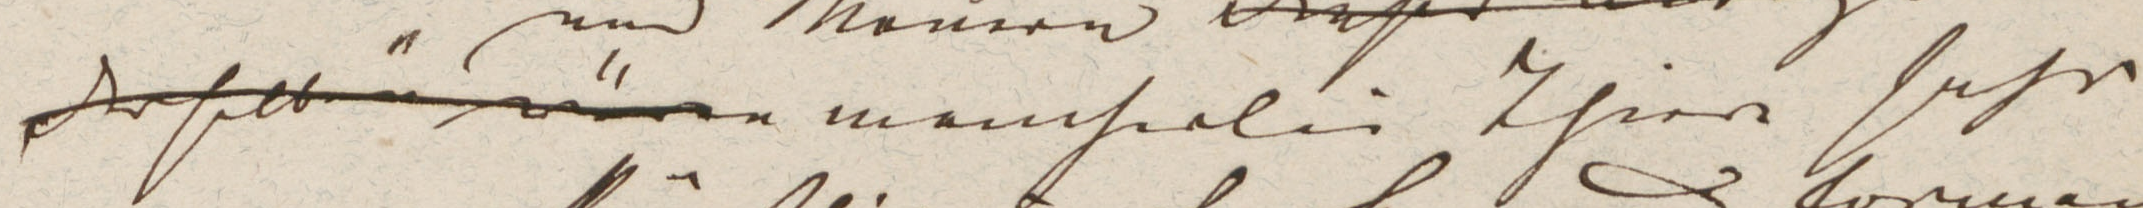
derselben wären mancherlei Thiere sehr
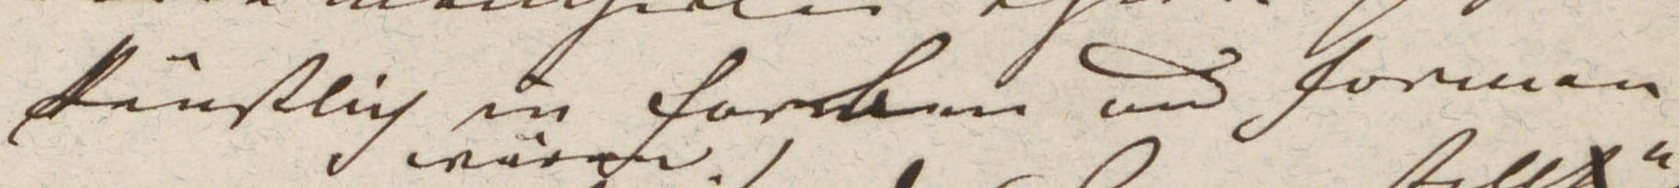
"künstlich in Farben und Formen
